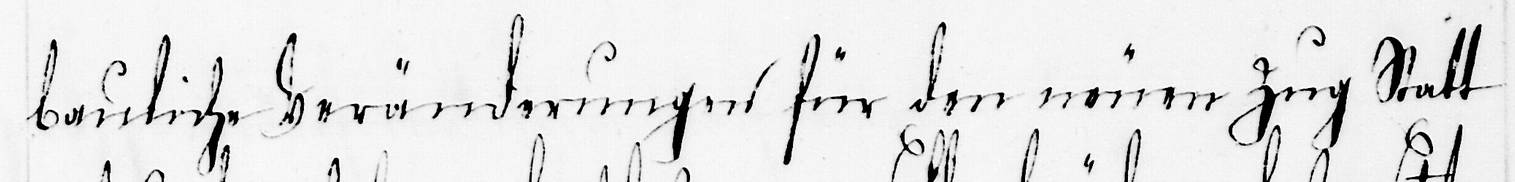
bauliche Veränderungen für den neuen Zug Statt
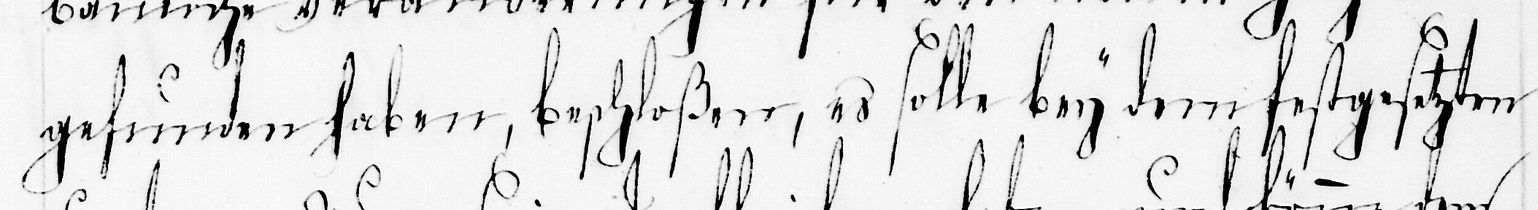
gefunden haben, beschloßen, es solle bey dem festgeset¬
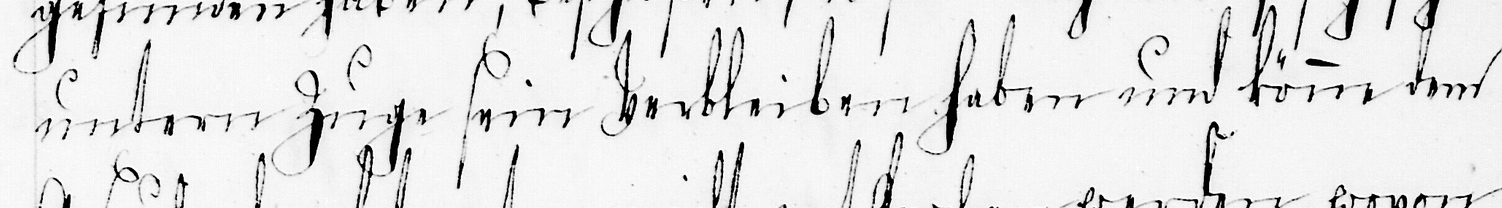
untern Zuge sein Verbleiben haben und könne dem
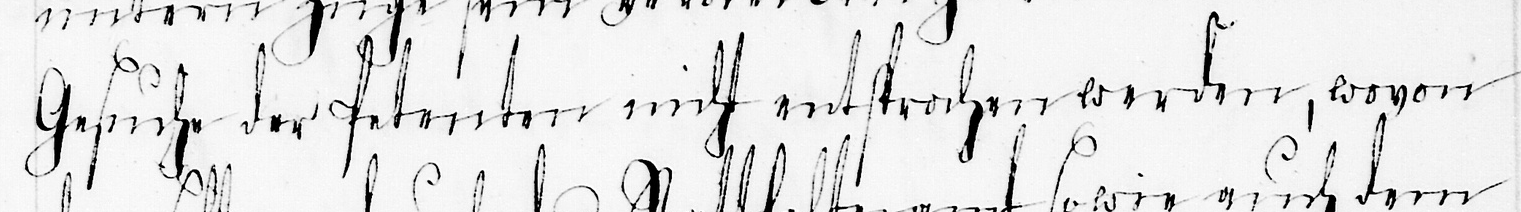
Gesuche der Petenten nicht entsprochen werden, wovon
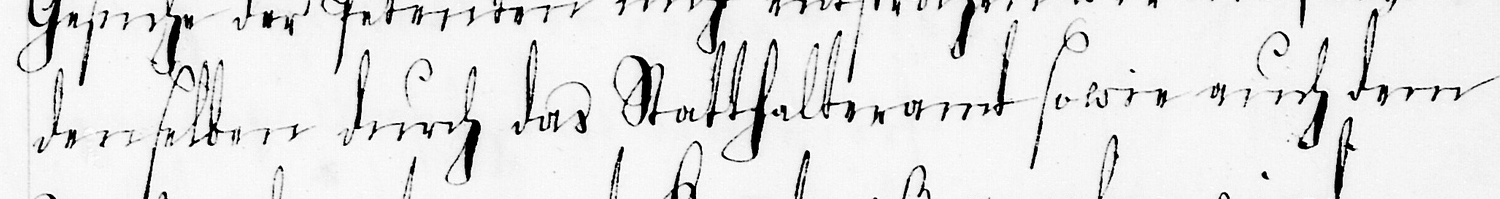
denselben durch das Statthalteramt sowie auch dem
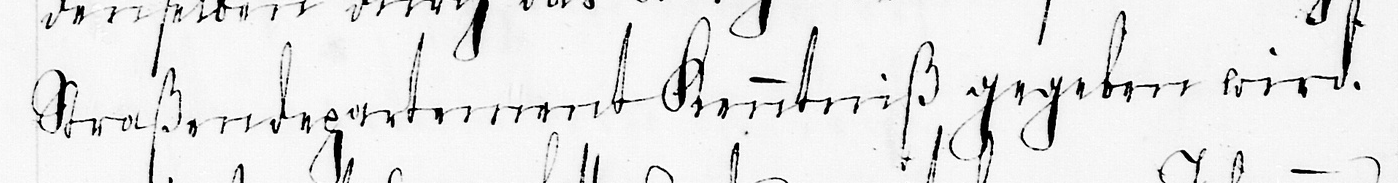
Straßendepartement Kenntniß gegeben wird.
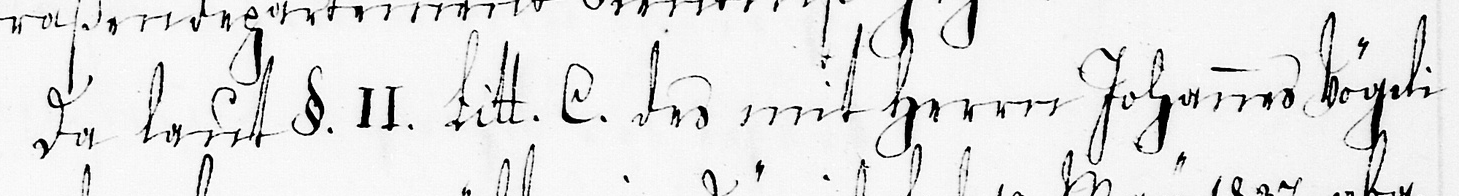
Da laut §. II. Litt. C. des mit Herrn Johannes Vögeli
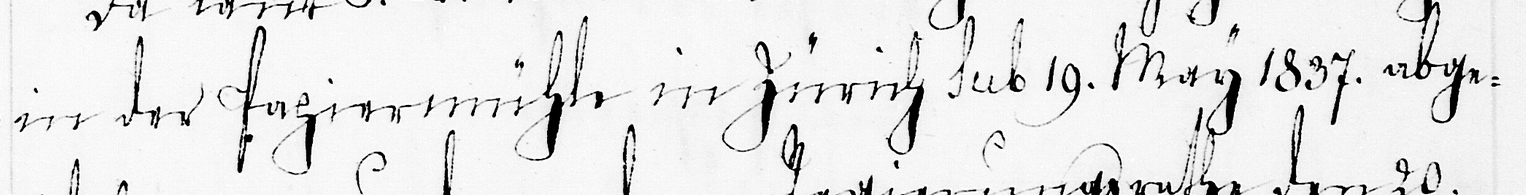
in der Papiermühle in Zürich sub 19. März 1837. abge¬
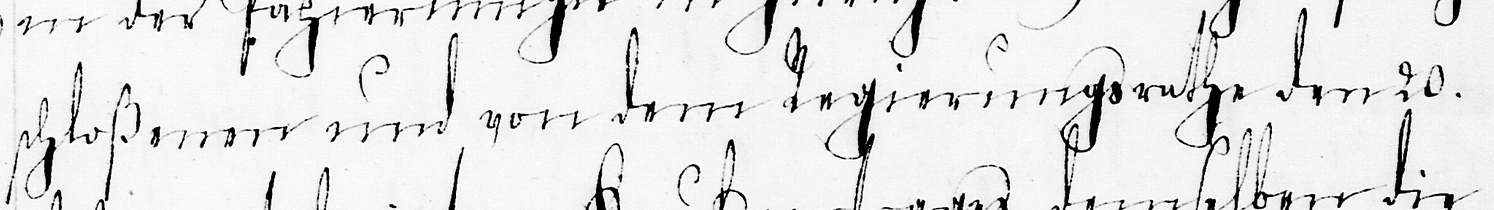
schloßenen und von dem Regierungsrathe den 20.
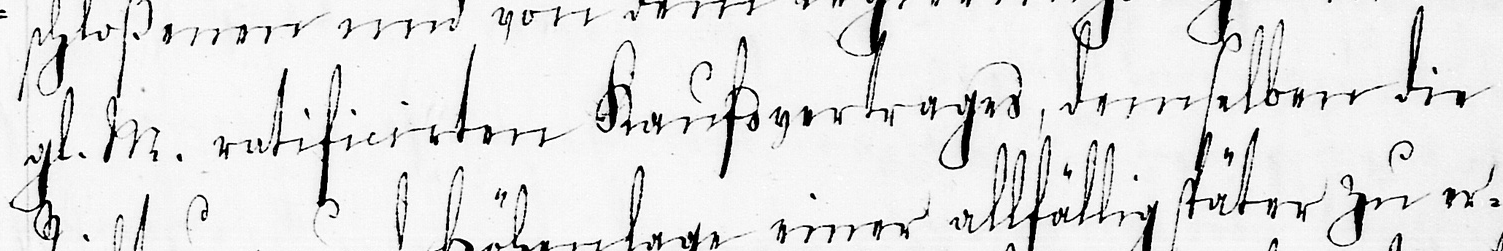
gl. M. ratificirten Kaufsvertrages, demselben die
